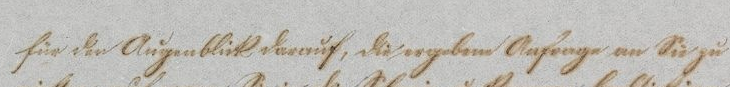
für den Augenblick darauf, die ergebene Anfrage an Sie zu
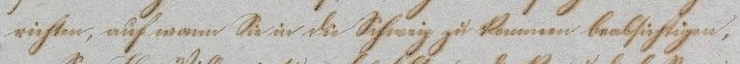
richten, auf wann Sie in die Schweiz zu kommen beabsichtigen,
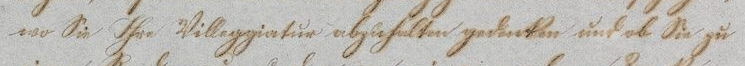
wo Sie Ihre Villegiatur abzuhalten gedenken und ob Sie zu
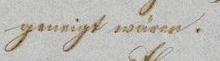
geneigt wären.
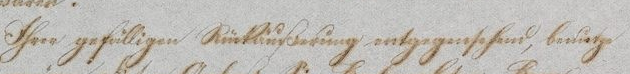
Ihrer gefälligen Rückäußerung entgegensehend, benutze
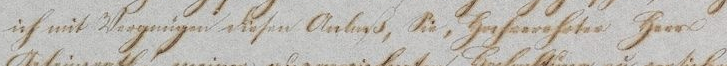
ich mit Vergnügen diesen Anlaß, Sie, Hochverehrter Herr
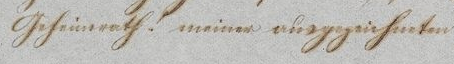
Geheimrath! meiner ausgezeichneten
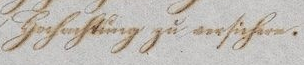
Hochachtung zu versichern.
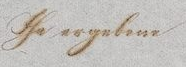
Ihr ergebene
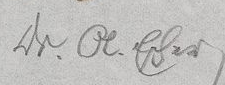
Dr A Escher
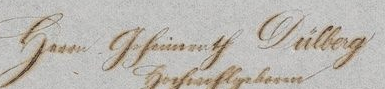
Herr Geheimrath Dülberg
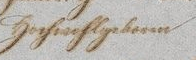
Hochwohlgeboren
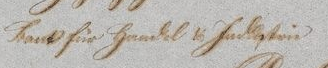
Bank für Handel & Industrie
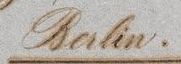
Berlin.
